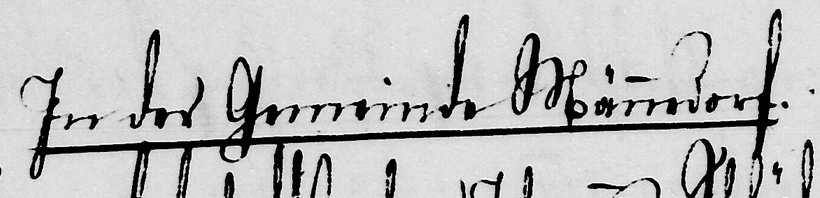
In der GemeindeMännedorf.
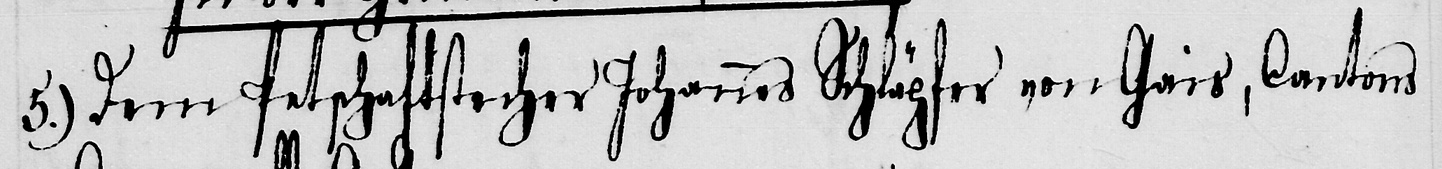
5.) Dem Petschaftstecher Johannes Schläpfer von Gais, Cantons
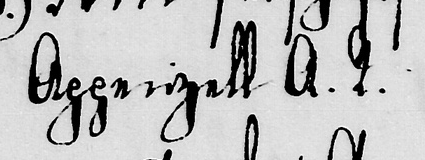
Appenzell A. R.
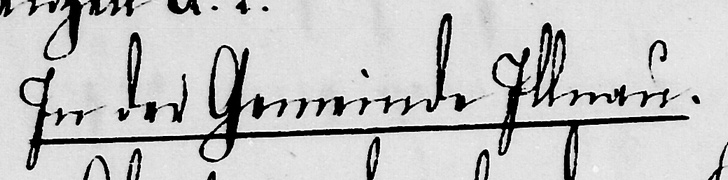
In der Gemeinde Illnau.
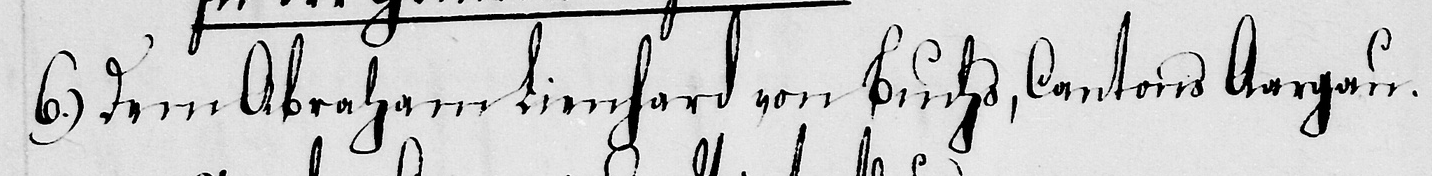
6.) Dem Abraham Lienhard von Buchs, Cantons Aargau.
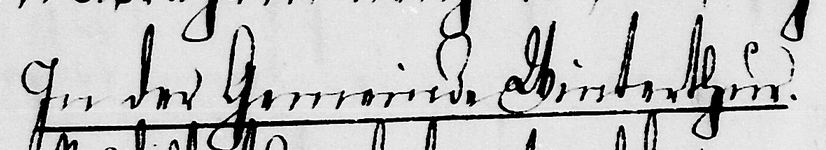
In der Gemeinde Winterthur.
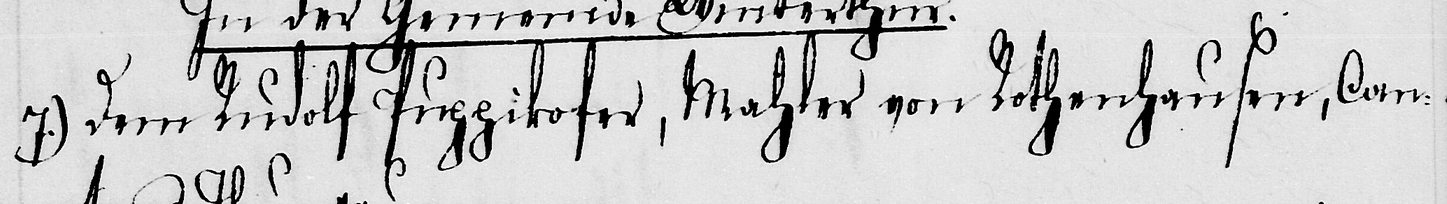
7.) Dem Rudolf Puppikofer, Mahler von Rothenhausen, Ca¬
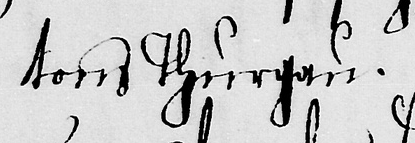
ntons Thurgau.
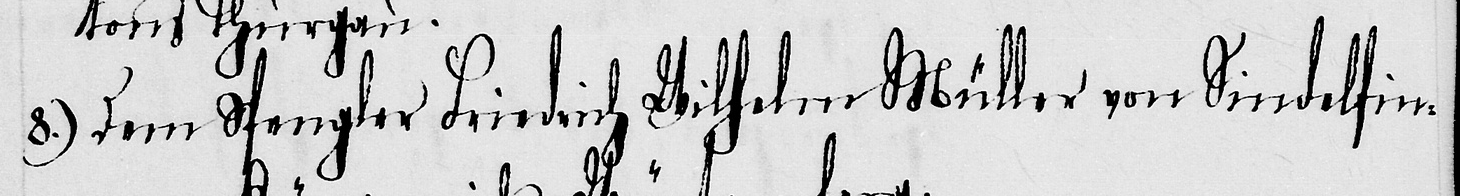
8.) Dem Spengler Friedrich Wilhelm Müller von Sindelfin¬
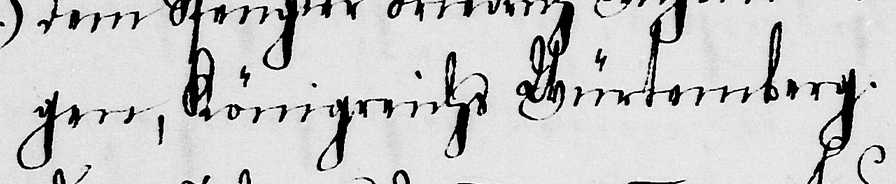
gen, Königreich Würtemberg.
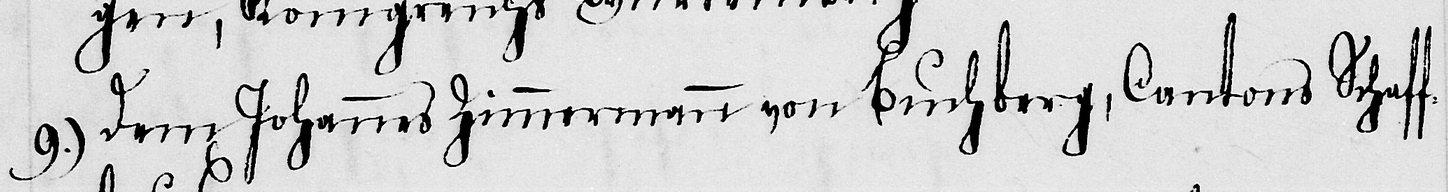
9.) Dem Johannes Zimmermann von Buchberg, Cantons Schaf¬
